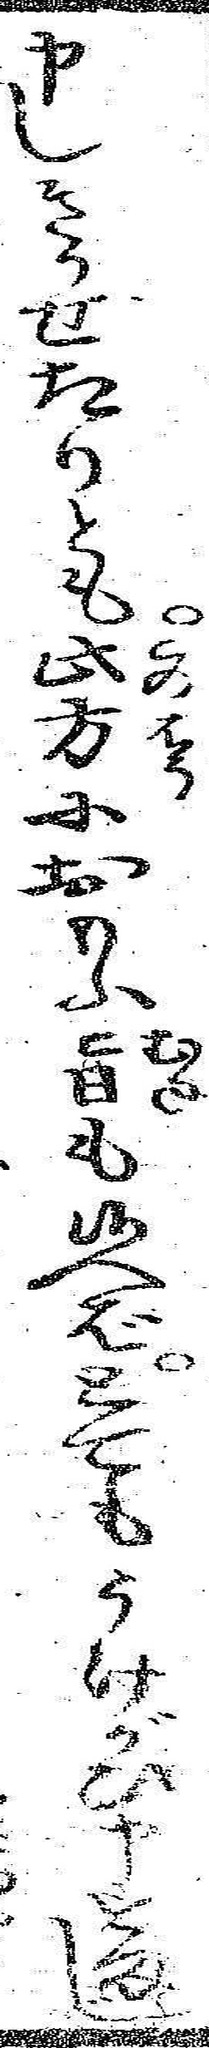申しきかせたりとも。此方におもふ旨も候へば。とてもうけがひ申すまじ
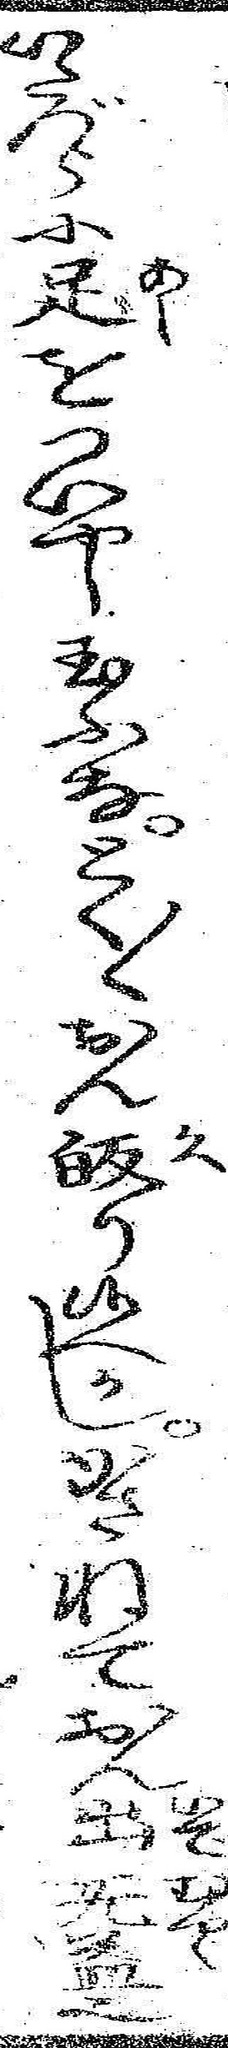いたづらに足をついやし玉ふな。とく〳〵おん帰り候へかし。かさねておん出無益也
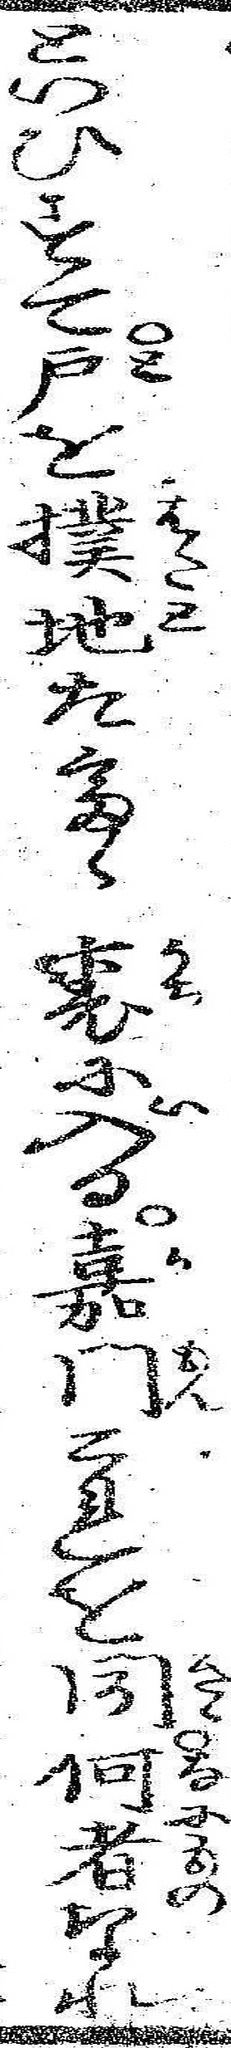といひすて。戸を撲地たてゝ裏に入る。嘉門これを聞。何者なれ
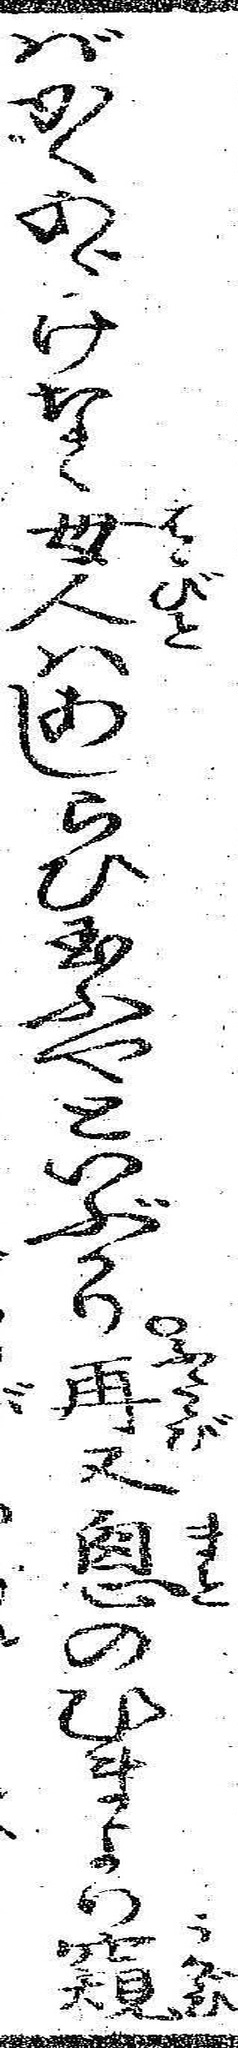ばかくあらけなく母人はあしらひ玉ふやといぶかり。再又窓のひまより窺
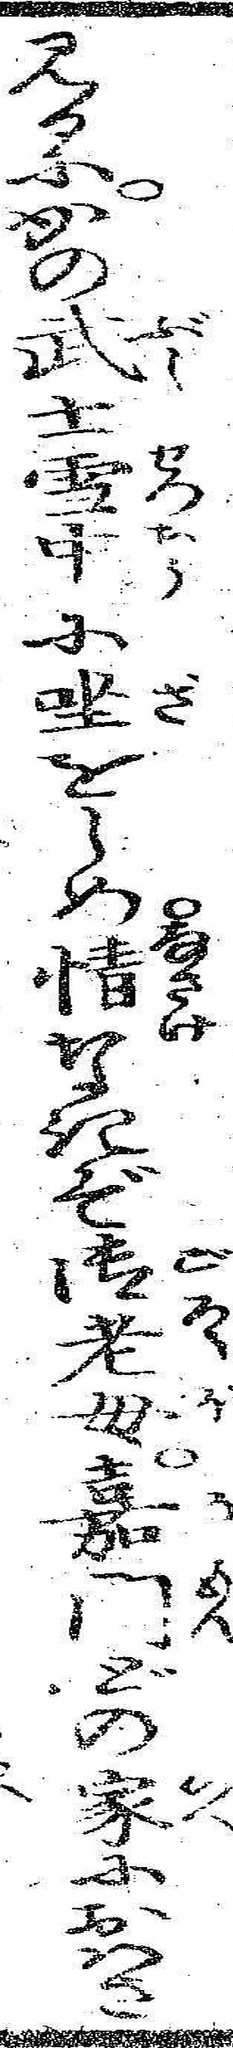見るに。かの武士雪中に坐をしめ。情なきぞ御老母。嘉門どの家におはさ
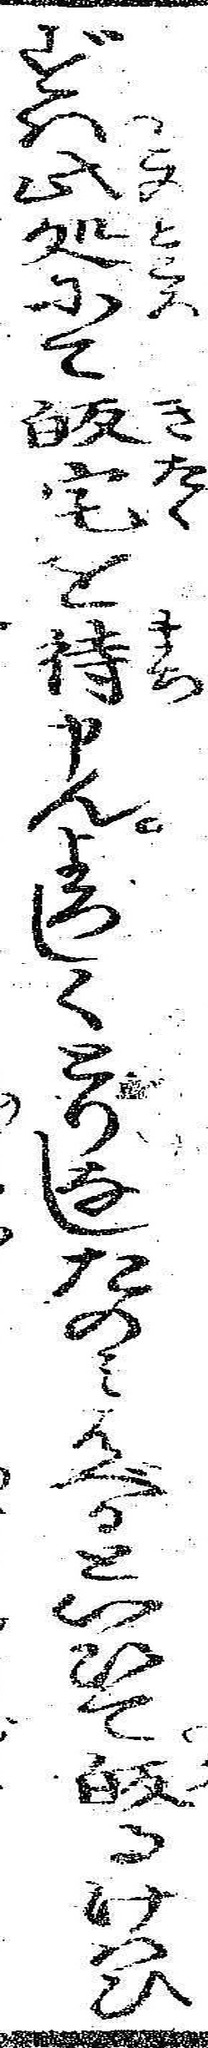ずは。此処にて帰宅を待申ん。よろしくとりなしたのみはべるといひて。帰るけはひ
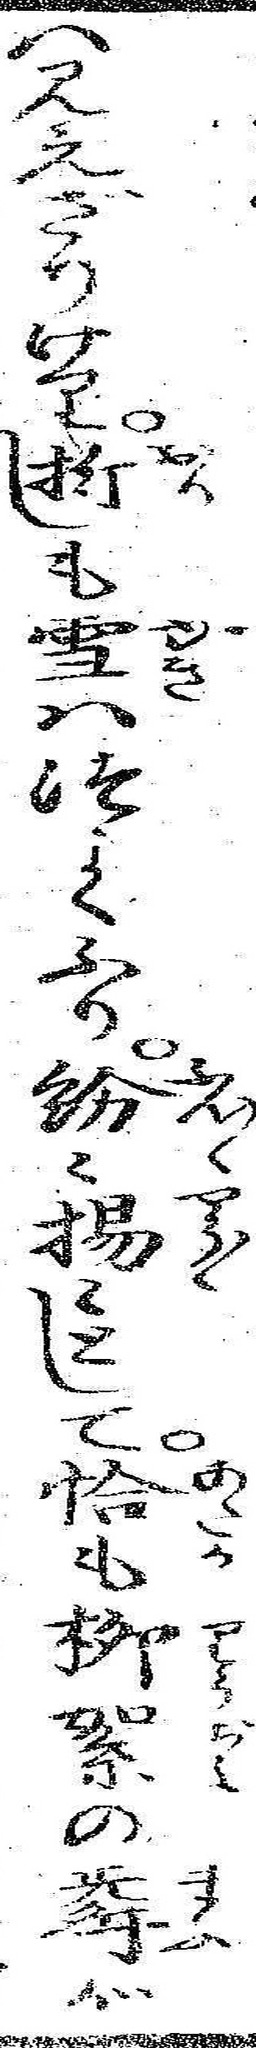は見えざりけり。折しも雪はつよくふり。紛々揚々として。恰も柳絮の舞が
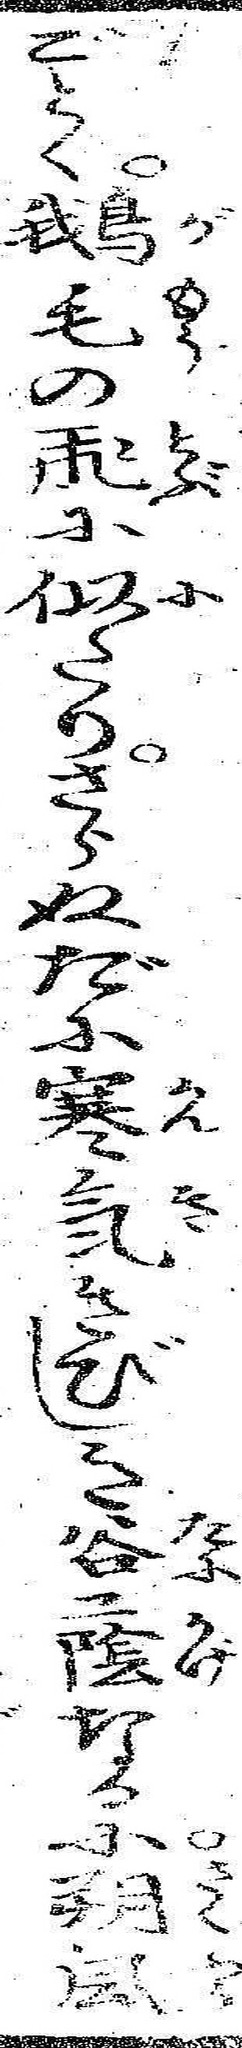ごとく。鵞毛の飛に似たり。さらぬだに寒気きびしき谷蔭なるに。朔風
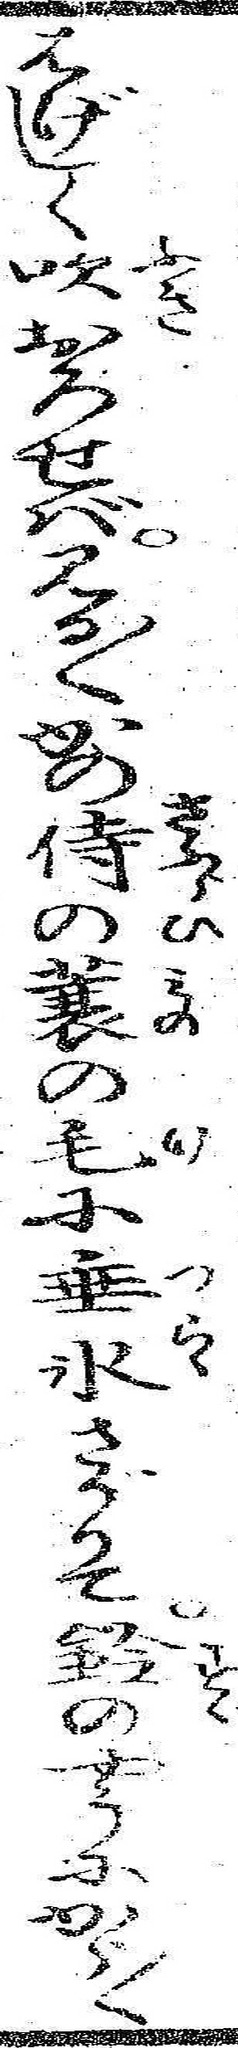はげしく吹おろせば。見る〳〵かの侍の蓑の毛に垂氷さがりて。鈴のやうにから〳〵
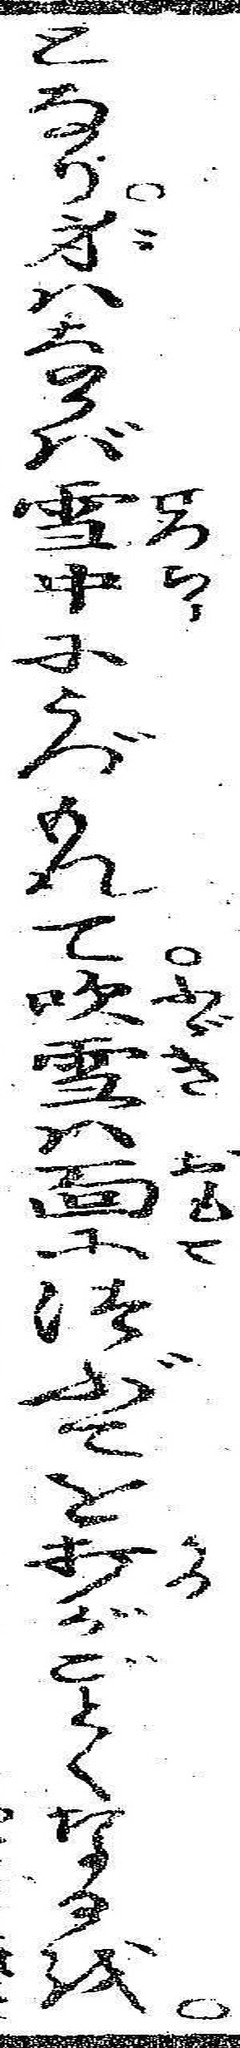となり。身はなかば雪中にうづもれて。吹雪は面につぶてを打がごとくなるを。
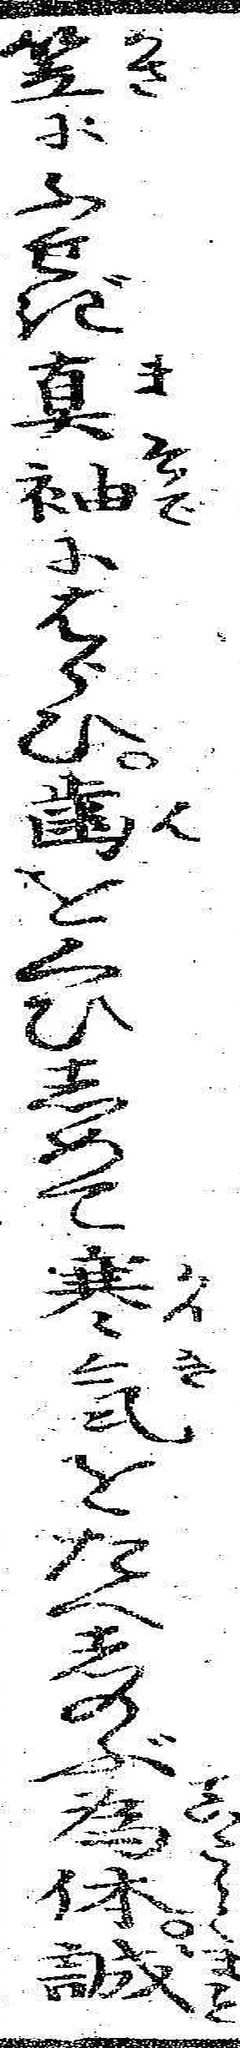笠にふせぎ真袖にはらひ。歯をくひしめて寒気をたへしのぶ為体。誠
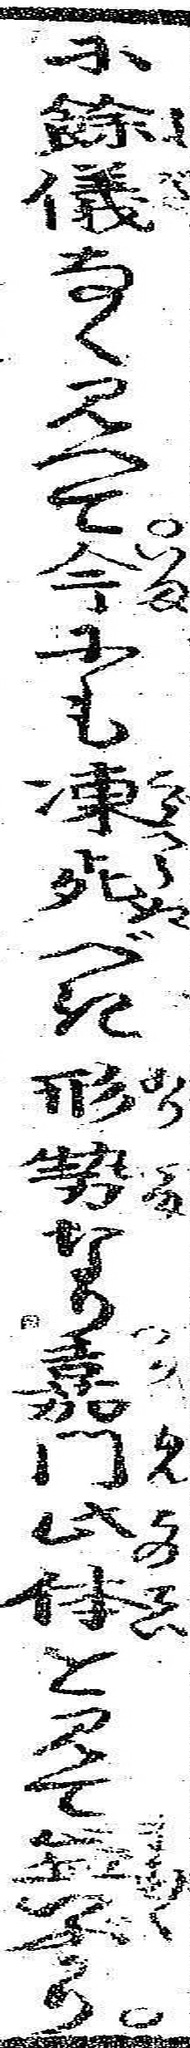に余儀なく見へて。今にも凍死べき形勢なり。嘉門此体を見て益いぶかり。
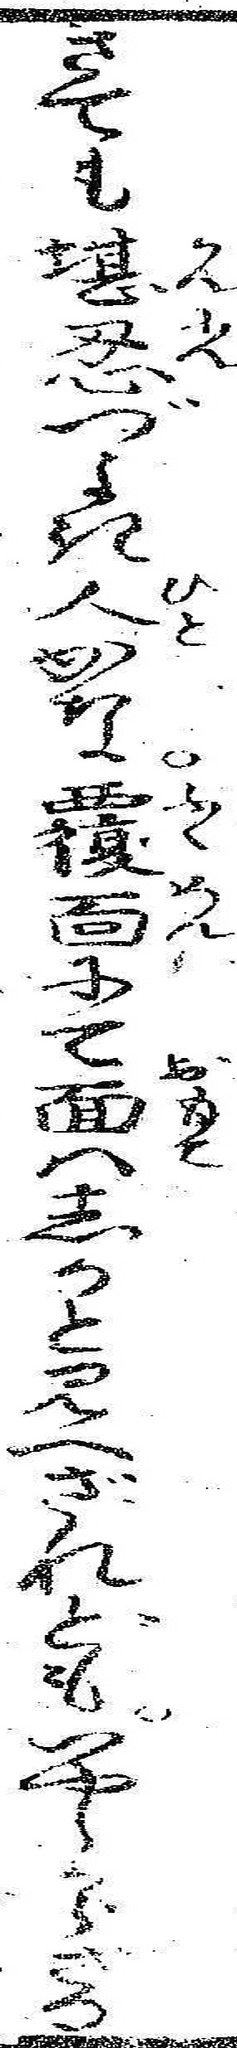さても堪忍づよき人かな。覆面にて面はしかと見へざれども。いやしからざる
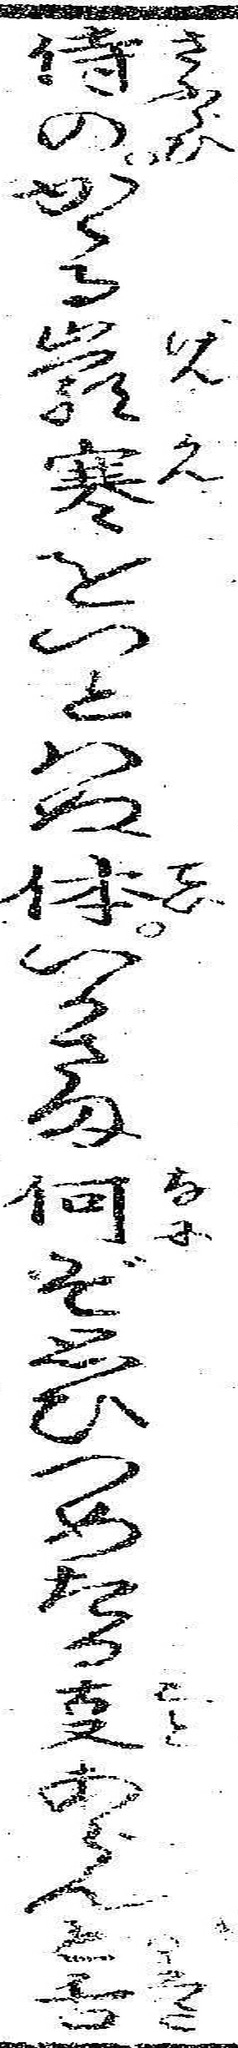侍の。かゝる厳寒をいとはぬ体。いかさま何ぞ思ひつめたる事あらんと。舌
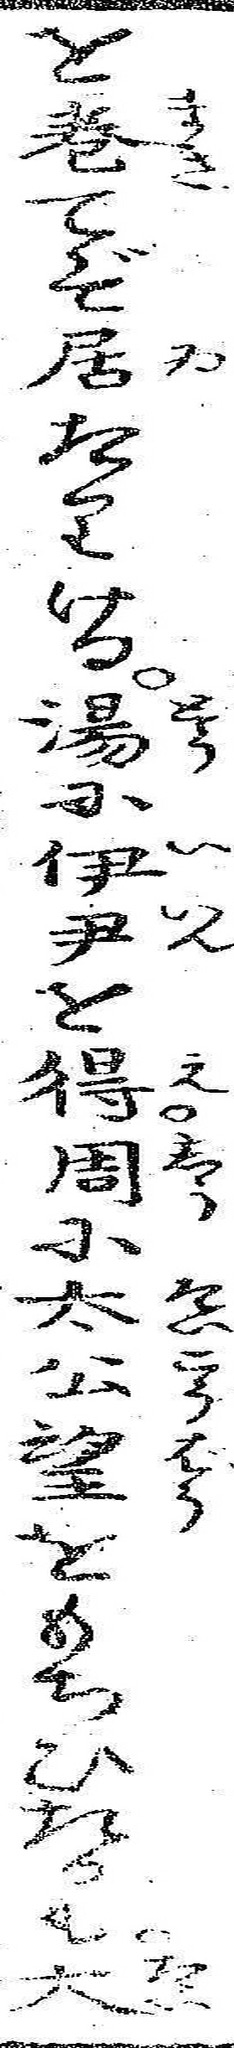を巻てぞ居たりける。湯に伊尹を得。周に太公望をもちひたるも。大
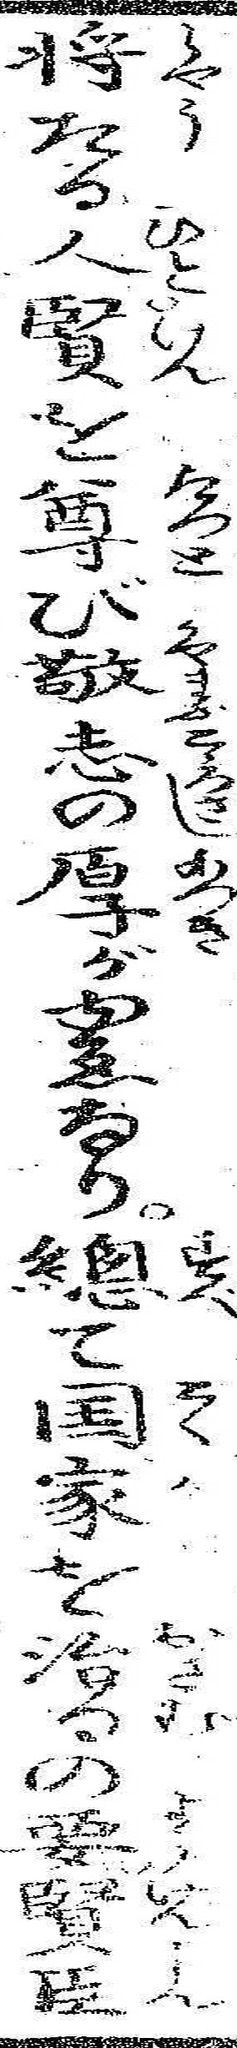将たる人。賢を尊び敬志の厚がゆゑなり。総て国家を治るの要。賢臣
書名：昔話稲妻表紙
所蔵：国文学研究資料館
